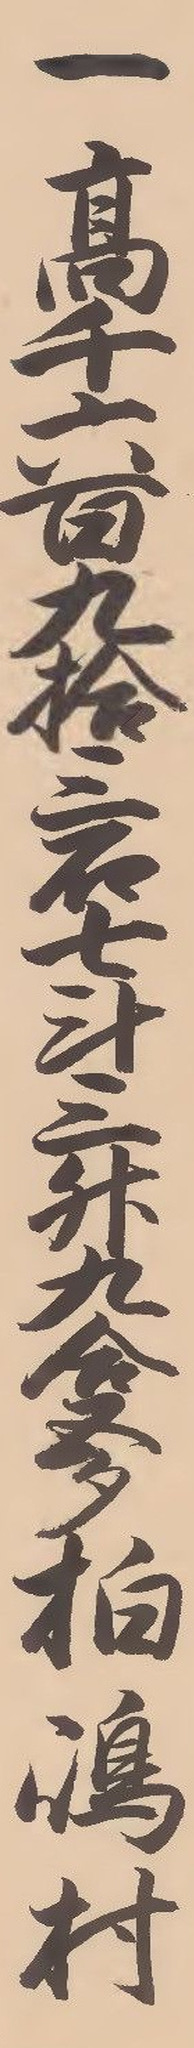一高千六百九拾三石七斗三升九合五勺柏島村
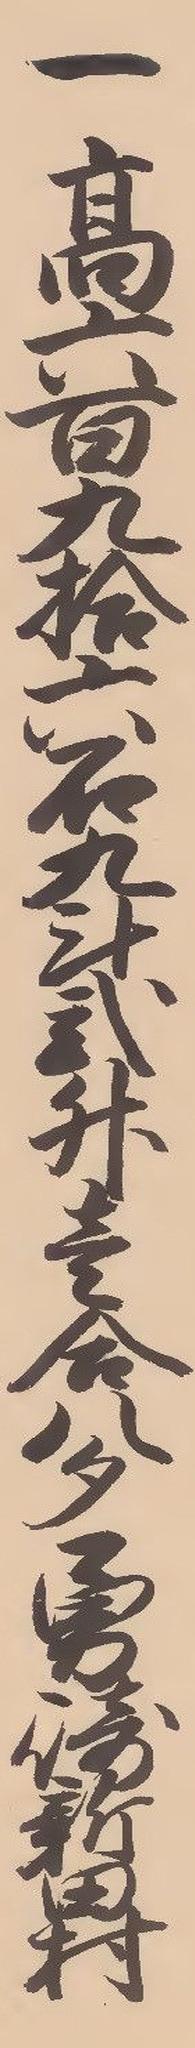一高六百九拾六石九斗弐升壱合八勺勇崎新田村
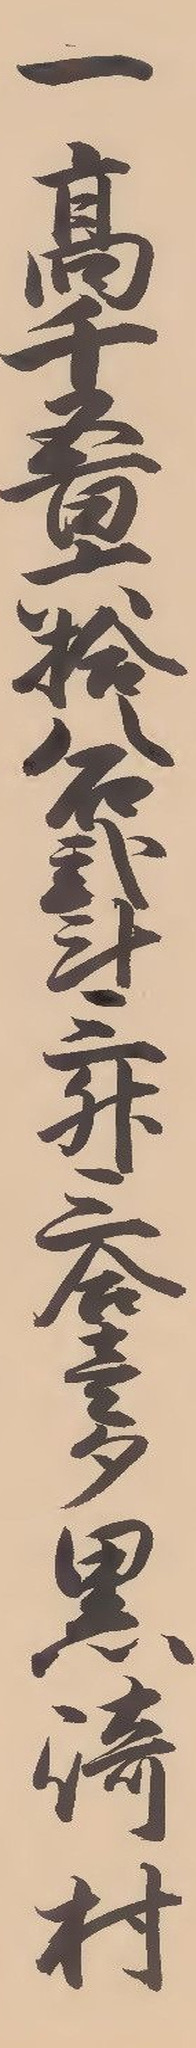一高千五百六拾八石弐斗三升三合壱勺黒崎村
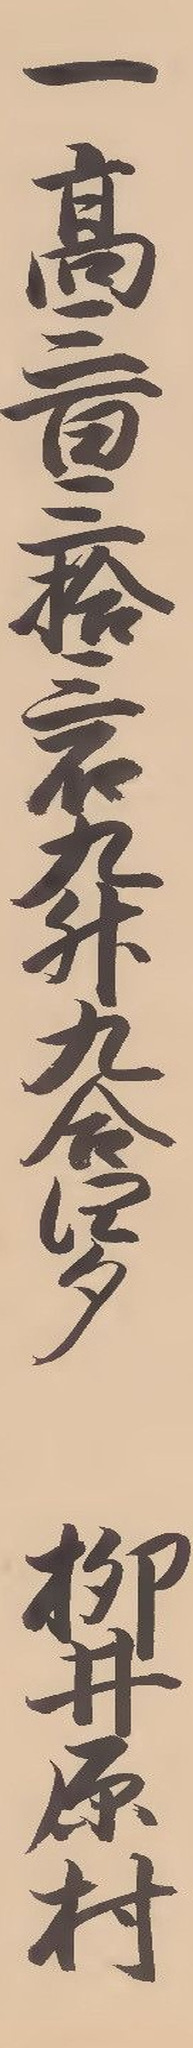一高三百三拾三石九升九合四勺柳井原村
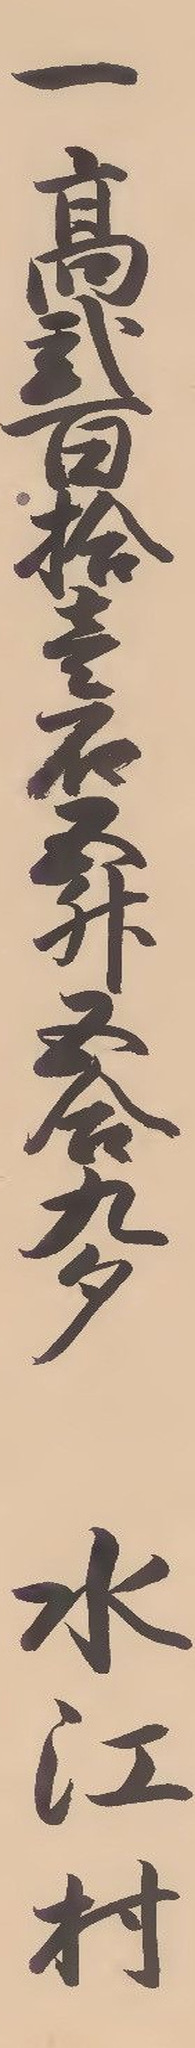一高弐百拾壱石五升五合九勺水江村

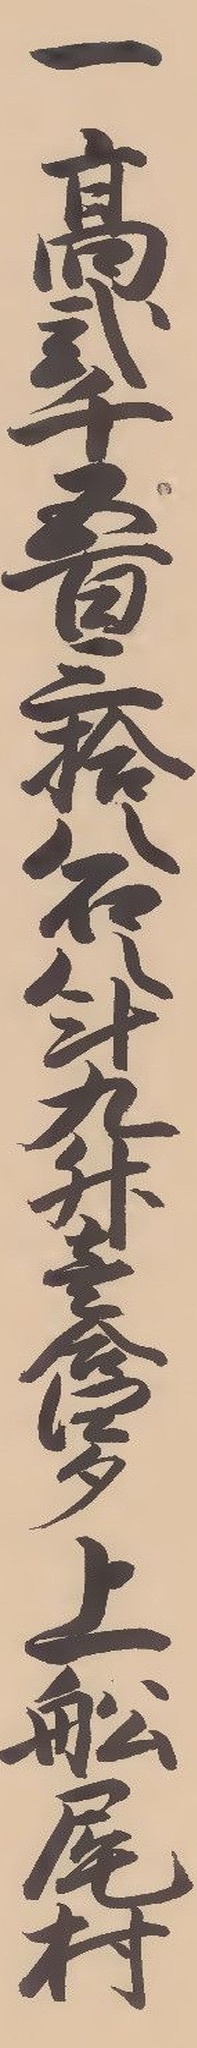一高弐千五百三拾八石八斗九升壱合四勺上船尾村
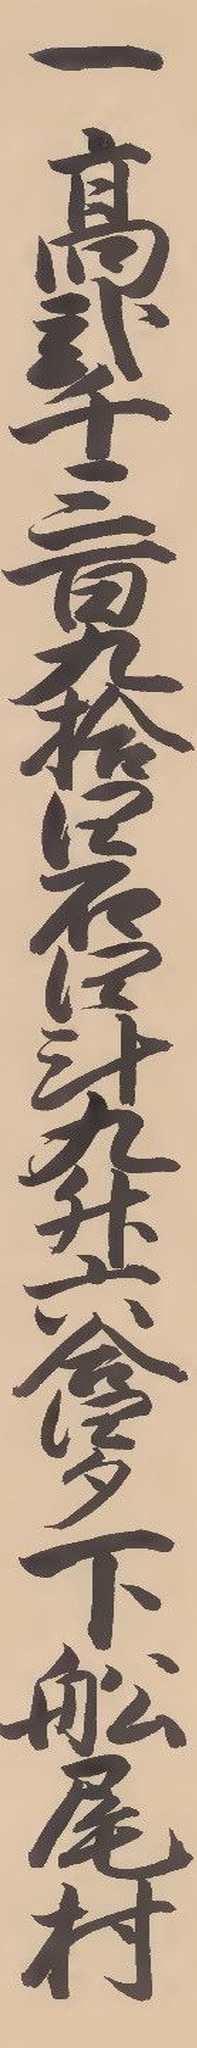一高弐千三百九拾四石四斗九升六合四勺下船尾村
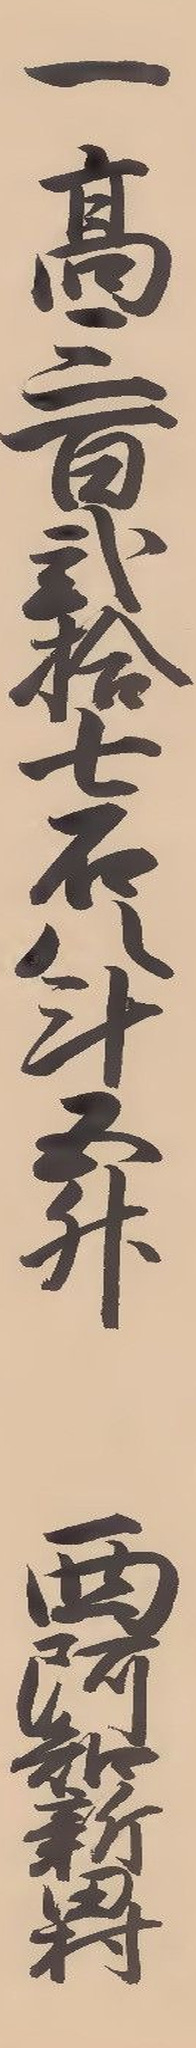一高三百弐拾七石八斗五升西阿知新田村
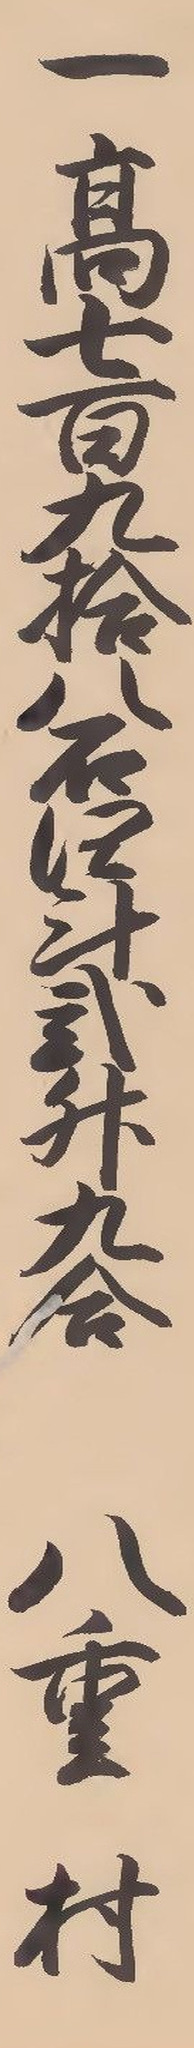一高七百九拾八石四斗弐升九合八重村
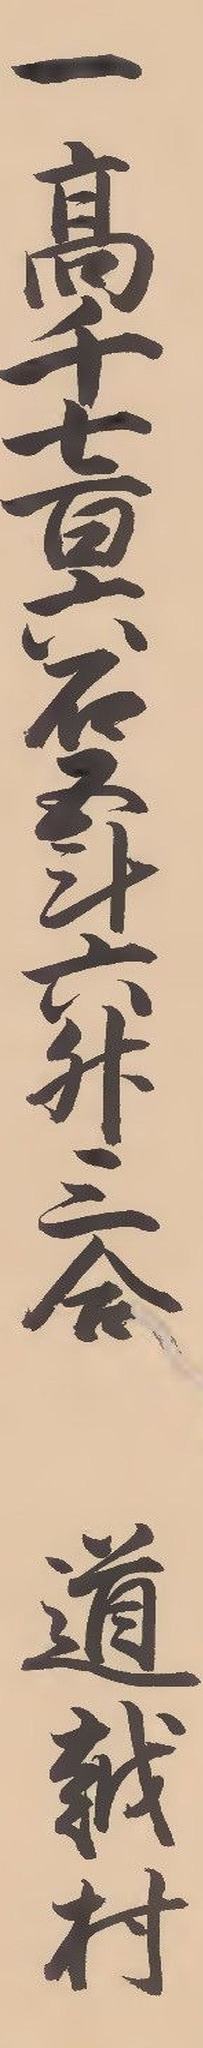一高千七百六石五斗六升三合道越村
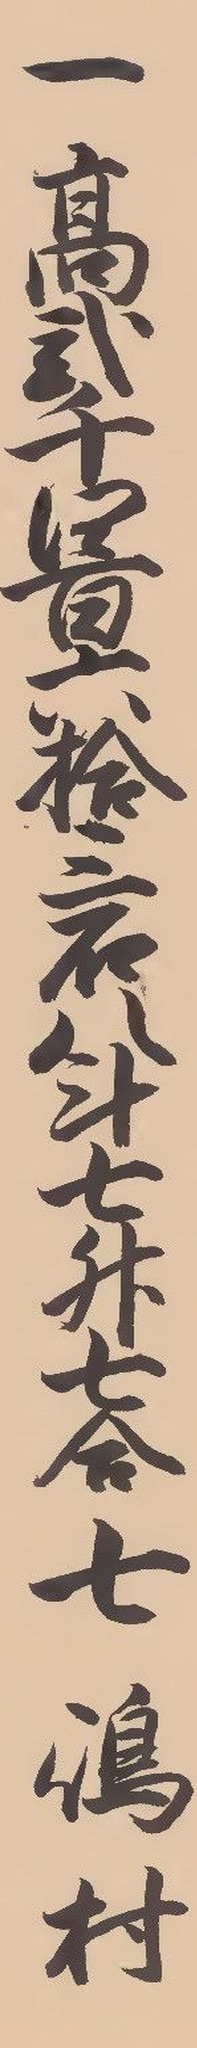一高弐千四百六拾三石八斗七升七合七島村
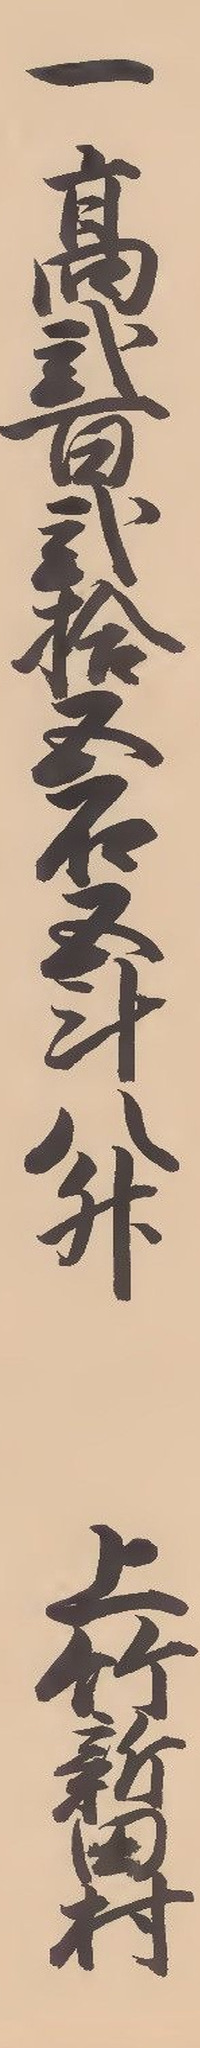一高弐百弐拾五石五斗八升上竹新田村
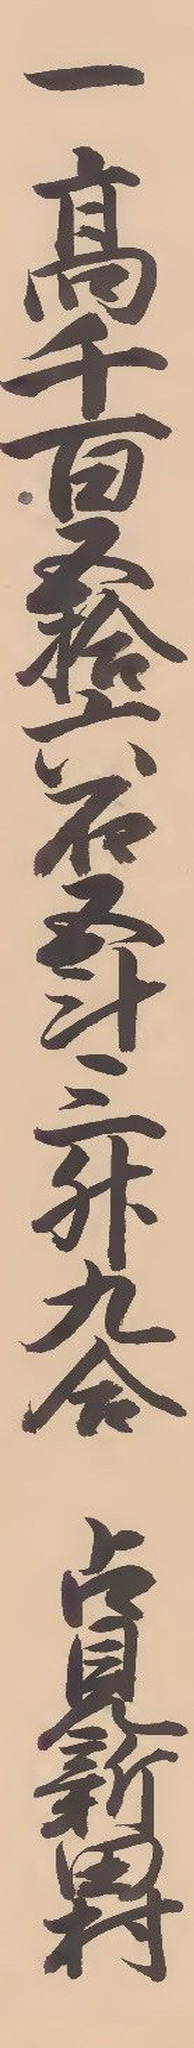一高千百五拾六石五斗三升九合占見新田村

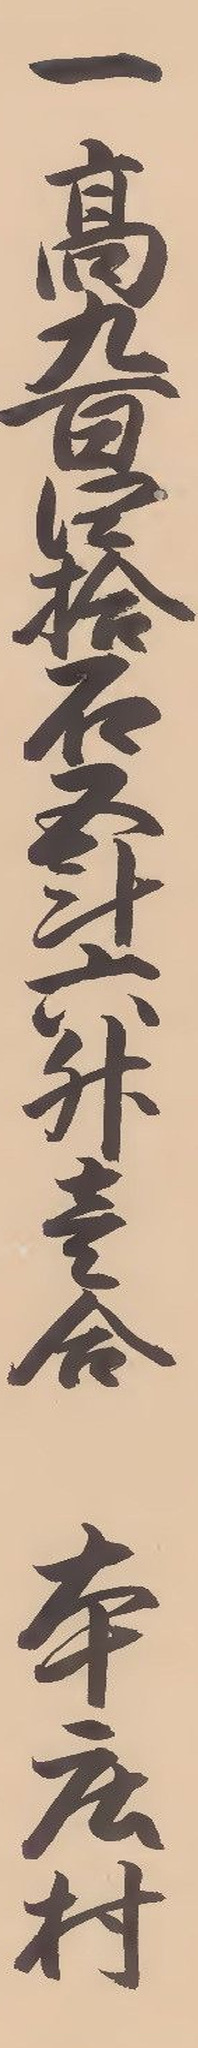一高九百四拾石五斗六升壱合本庄村
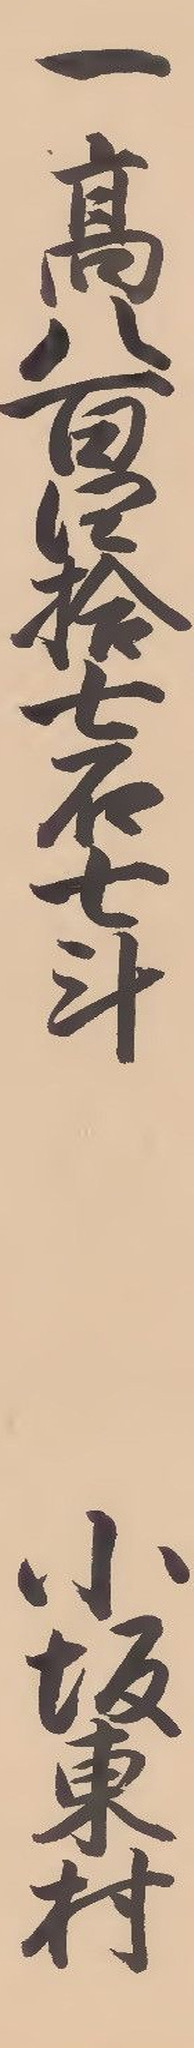一高八百四拾七石七斗小坂東村
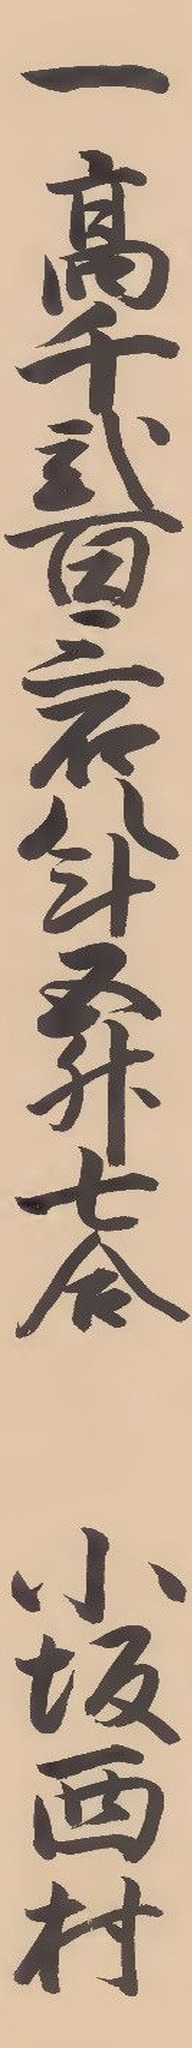一高千弐百三石八斗五升七合小坂西村
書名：備中国郷帳
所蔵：国立公文書館 National Archives of Japan
